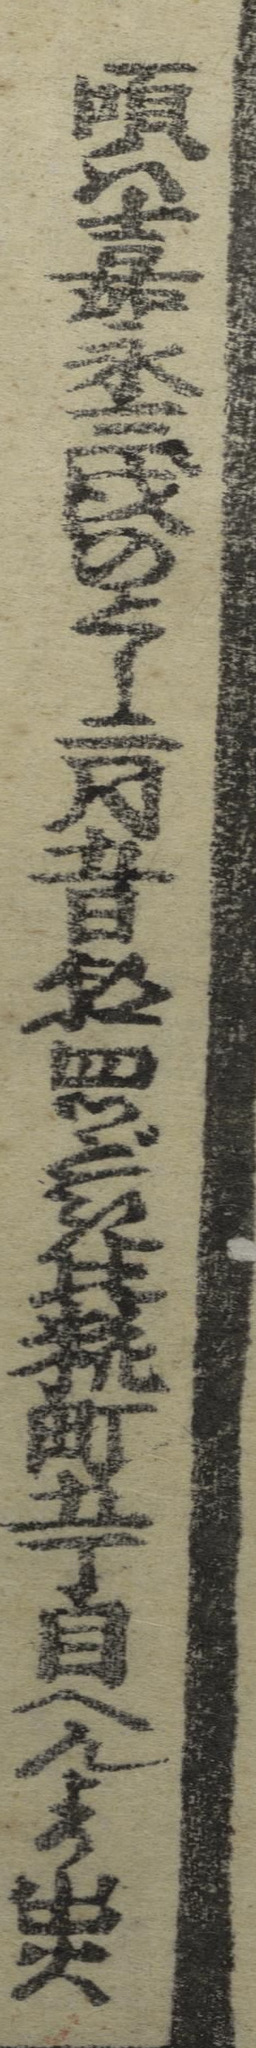頃は嘉永三戌のとし二月五日朝四つどき北糀町五丁目へんより出火
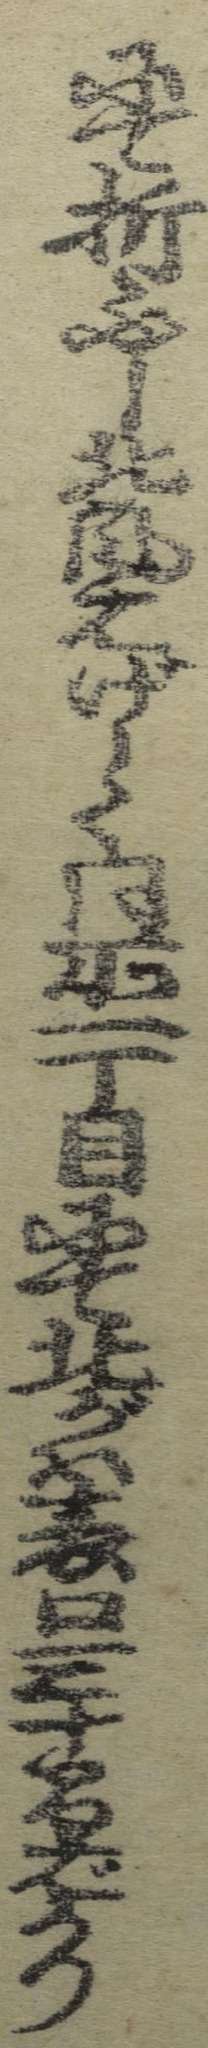にて折ふし北風はげしく同所一丁目にて北がわ表口三十間ばかり
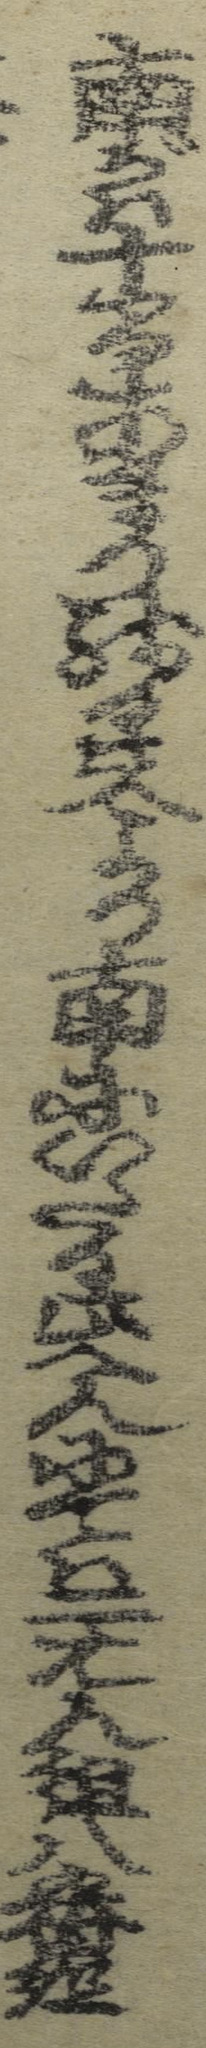南がは十間あまり残る夫より南にいたる此へんにては二はん組八番組
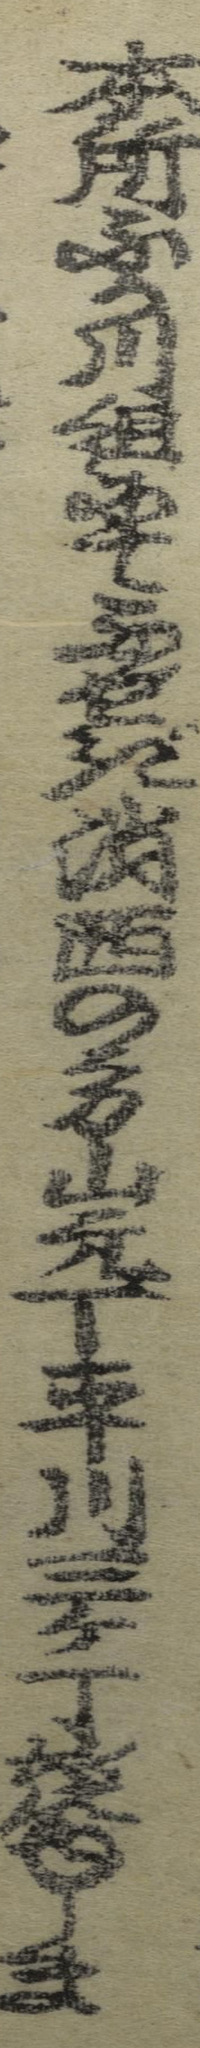本所ふか川組にてふせぎ消西の方山元丁平川三ケ丁焼ゆしま
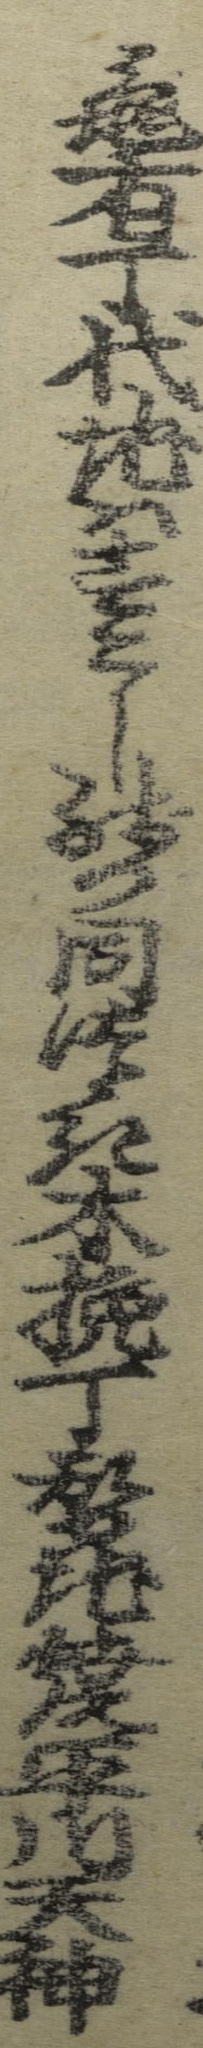亀有丁代地はすこし残り同つゝき木挽丁替地焼平川天神
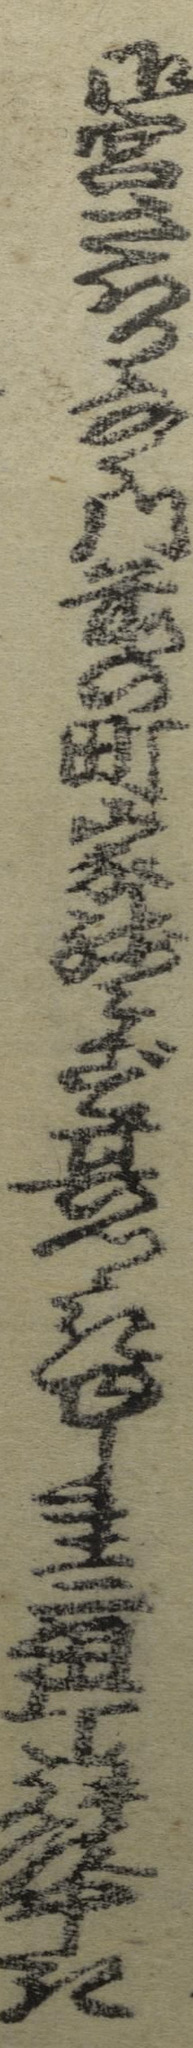御宮さはりなく門前の町家残らず其つゝきゆしま三組丁拝領やしき
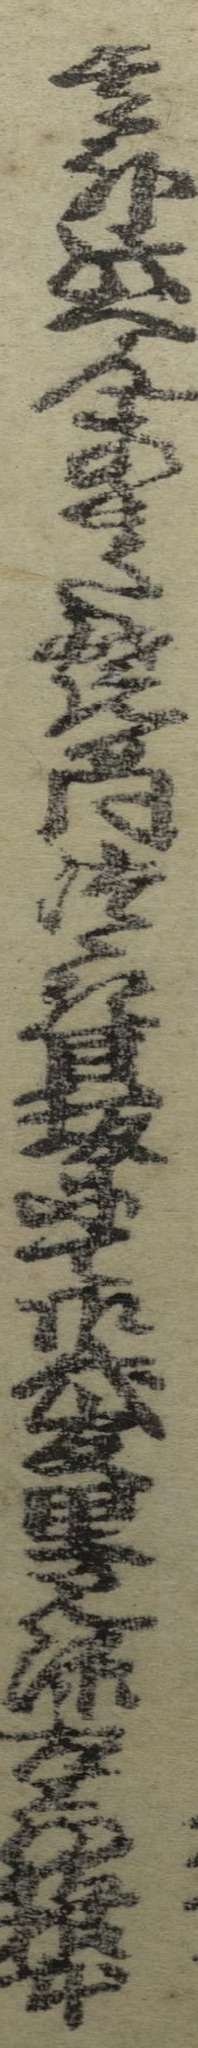其外此へんあまた焼る同つゝき貝坂にて御代官里見源左衛門様根本
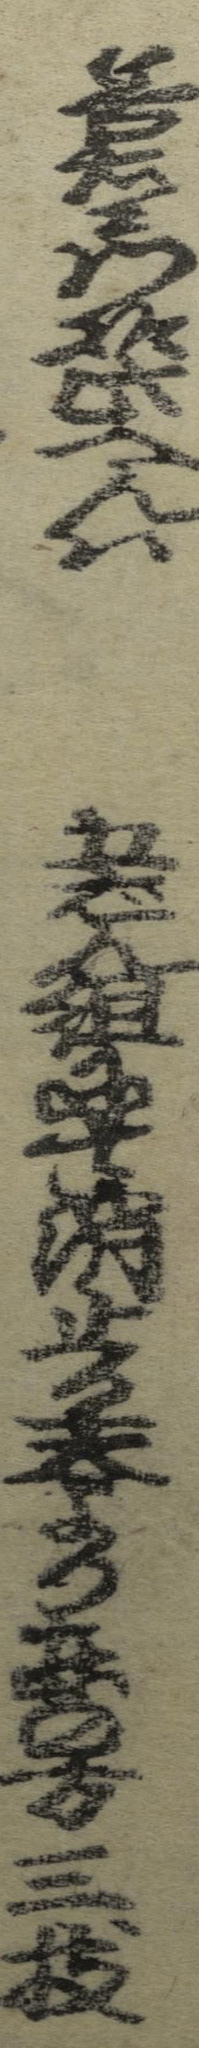善右衛門様此へんは五ばん組にて消止る夫れより西の方三枝
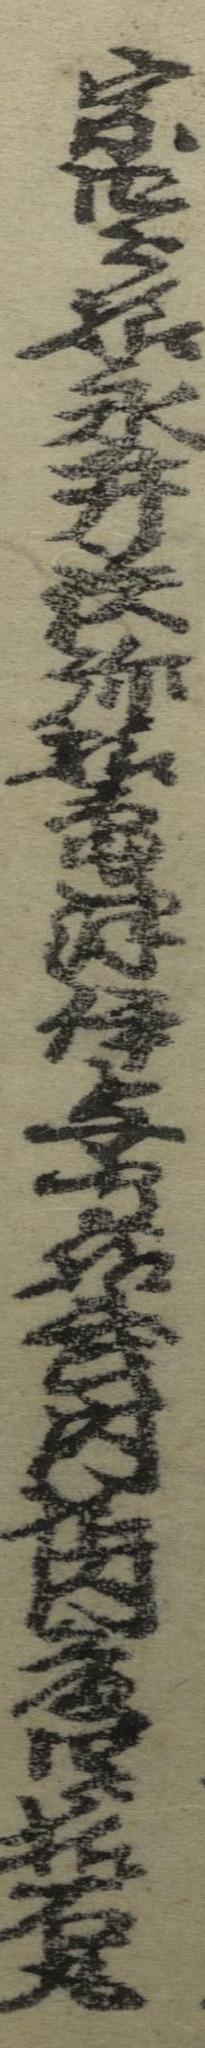宗四郎様永井鉄弥様島津伊与守様武内様内藤四郎様石丸
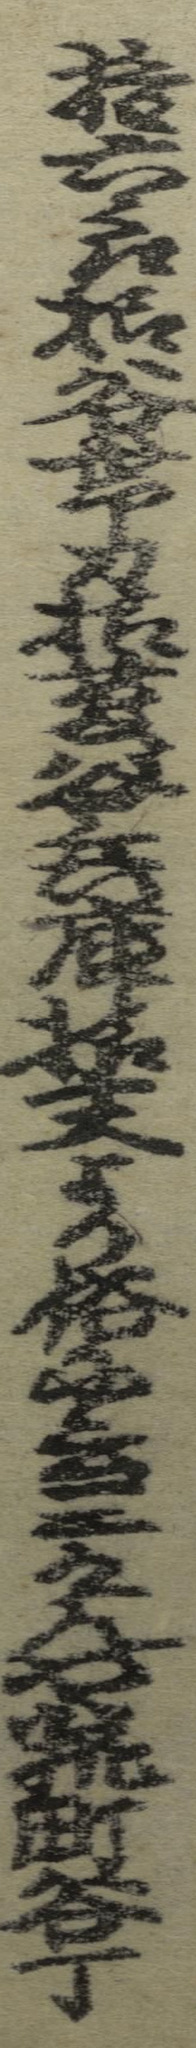権六郎様谷帯刀様菅谷兵庫様夫より俗に云三けんや糀町谷丁
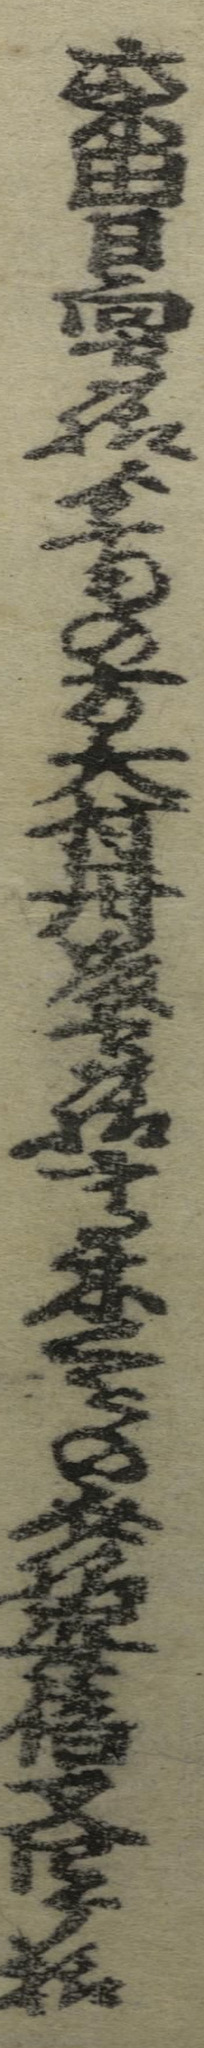柴田日向守様ゟ南の方大村丹後守様高木進の介様安倍又四郎様
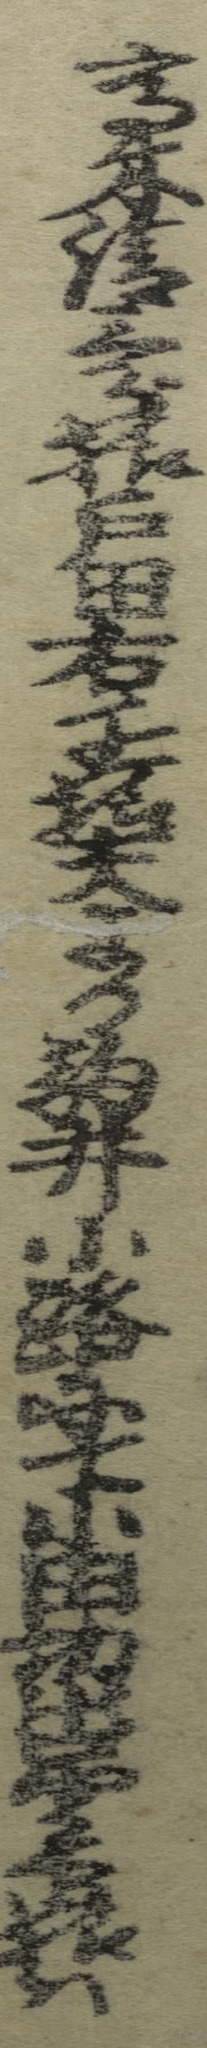高木清三郎様戸田右近様夫より駒井小路にて小田切出雲様は
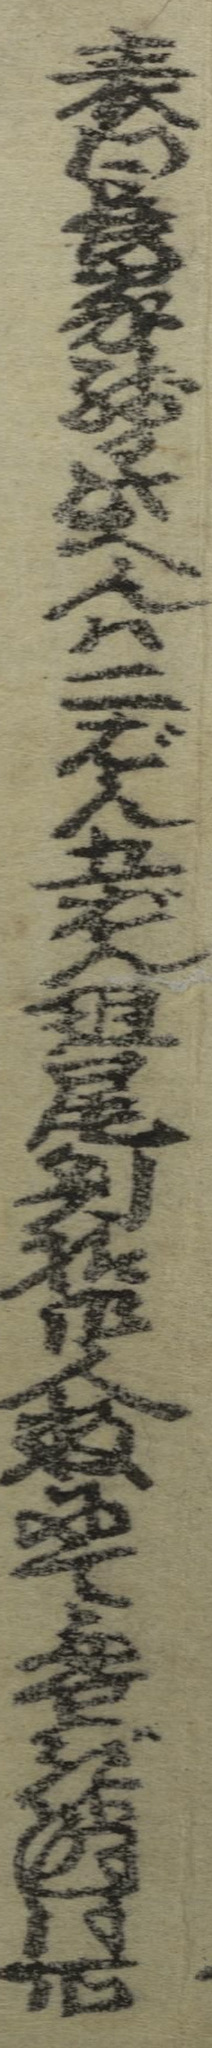表門長家残る此へんはニばん五ばん組尾州様御人数にてふせぎ消同所
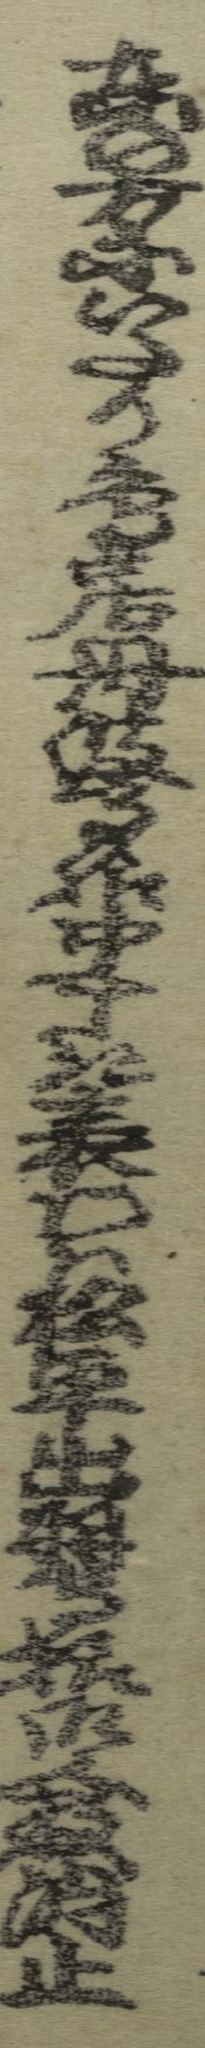東の方にいたり鳥居丹波守様中やしき表門は松平出羽守様御人数消止
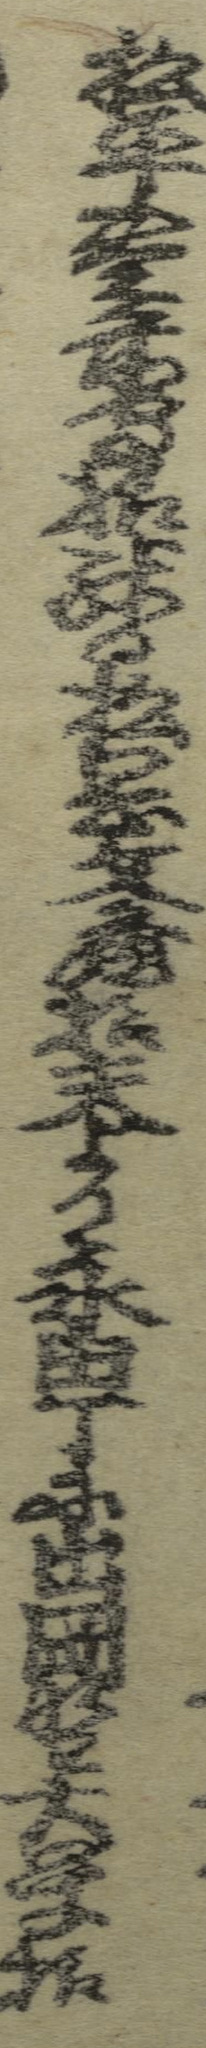松平豊前守様残る松岡文蔵様夫より永田丁に出岡野大学様
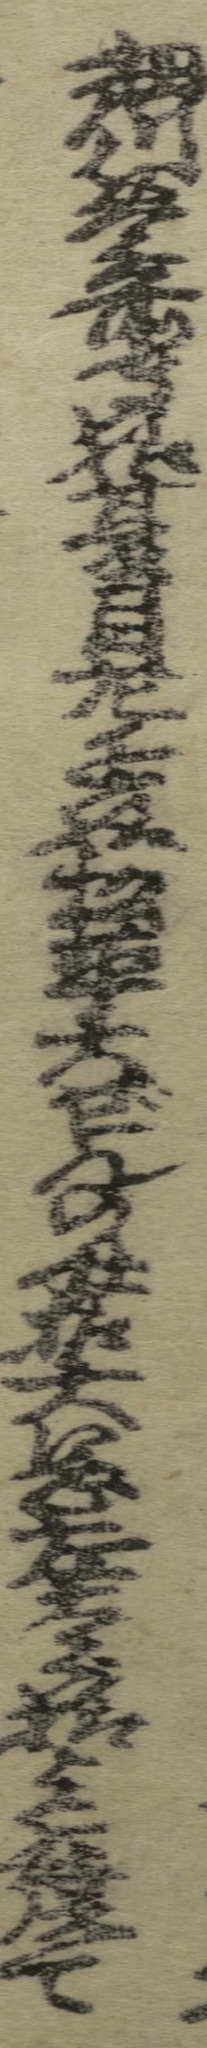細川豊前守様夏目左近様松平大ぜんの介様大岡左太郎様迄焼て
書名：[嘉永三年二月の江戸大火に関する瓦版]
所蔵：東京大学地震研究所図書室 Earthquake Research Institute Library, The University of Tokyo, JAPAN
